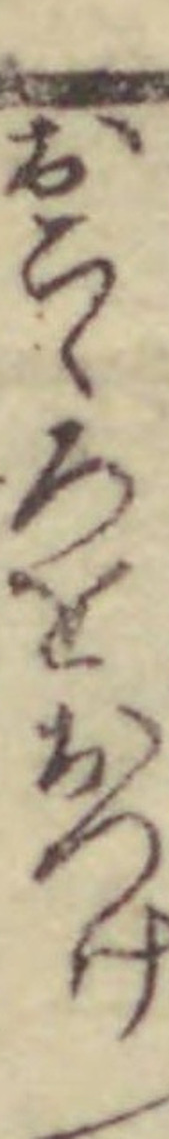おこゝろをおつけ
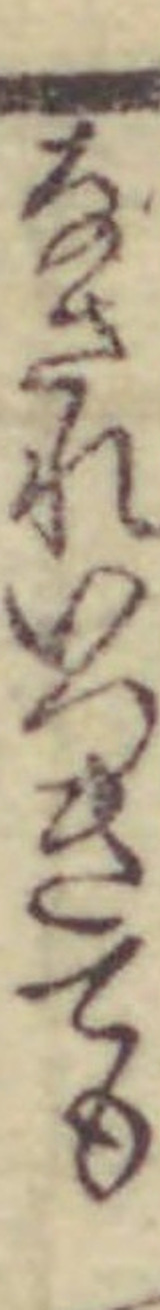なされいつきても
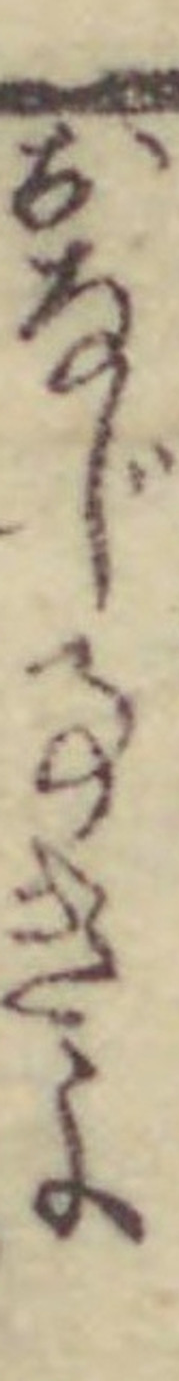おなじ事きよ
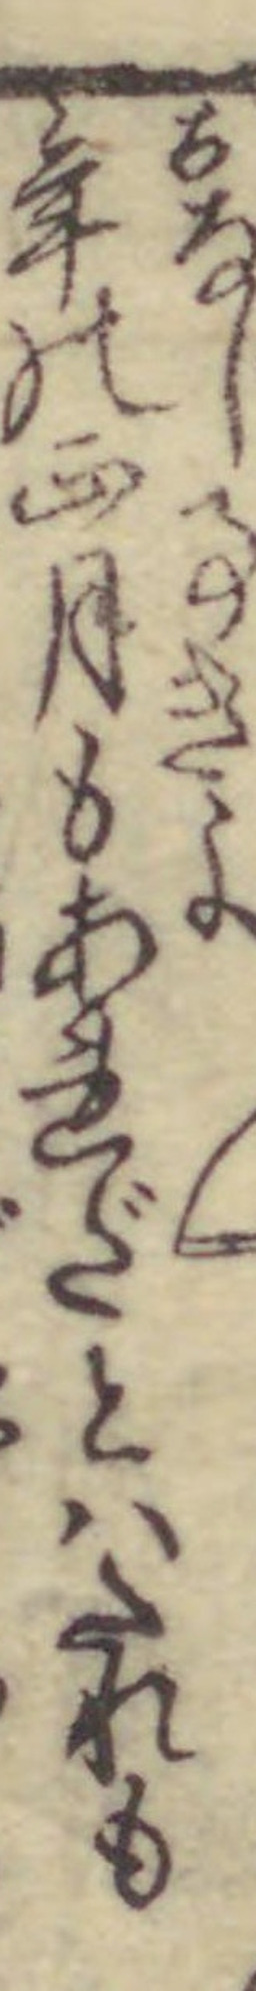年の正月もあれだとはたれも
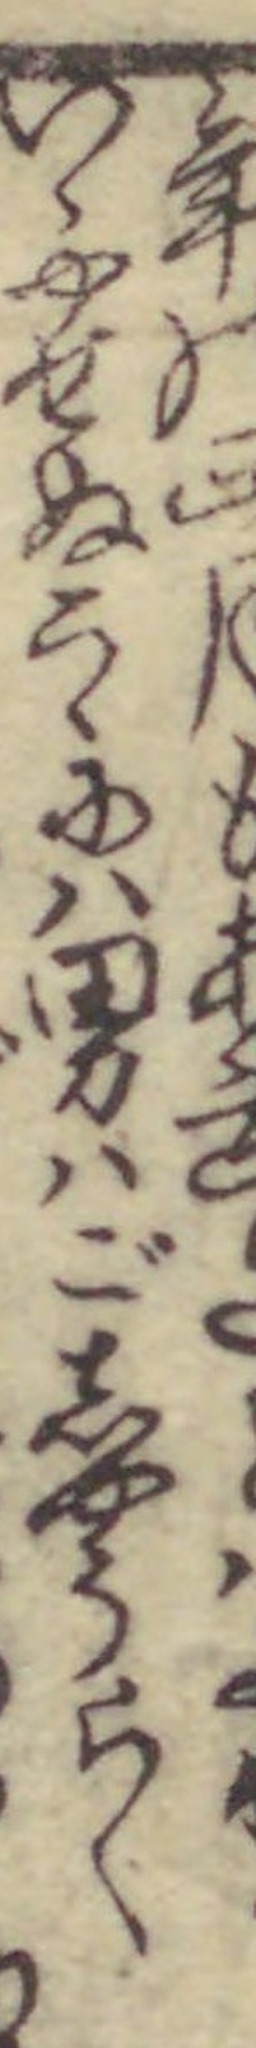いゝやせぬこゝには男はごしやうらく
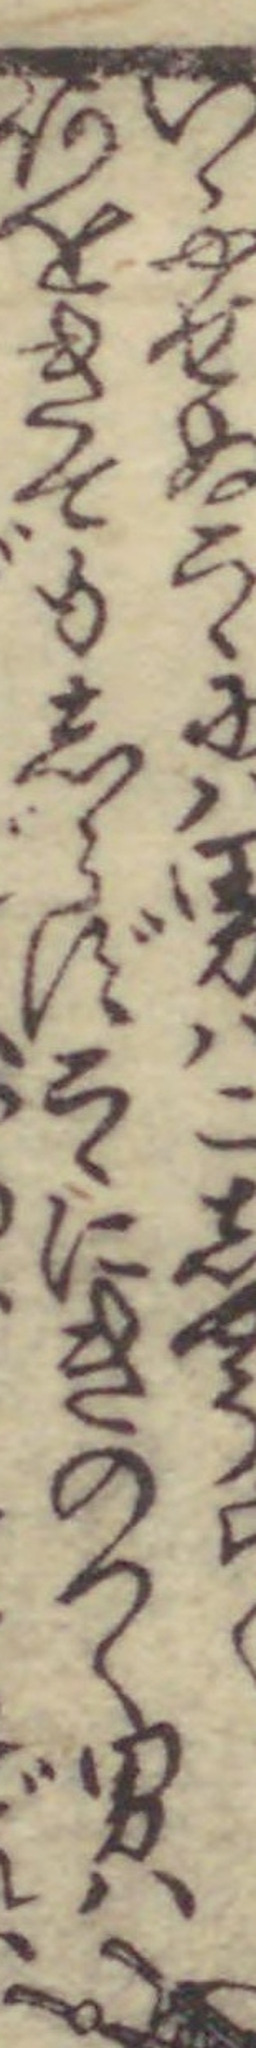何をきてもしらずこゝにきのつく男は
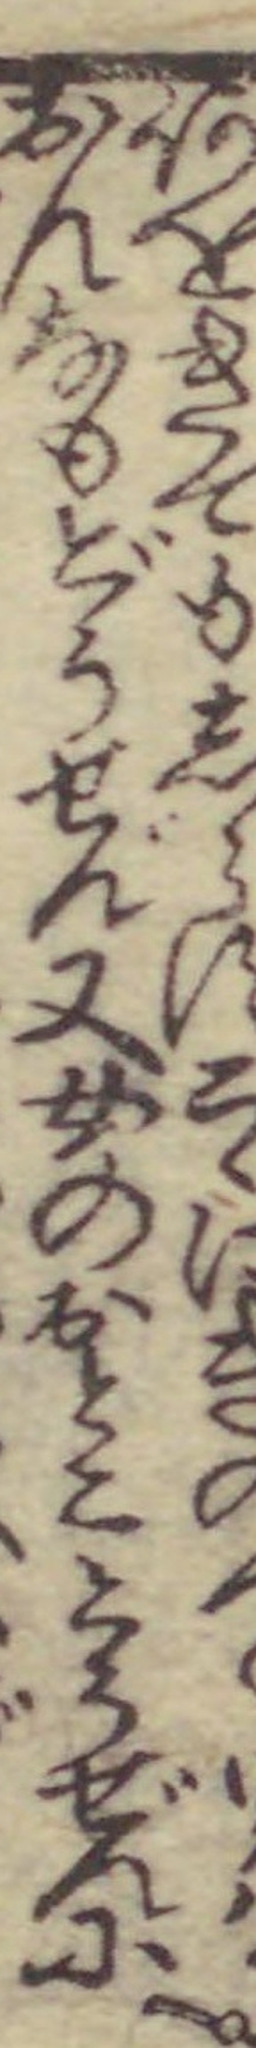おんなもどうせん又女のおとことうぜんに
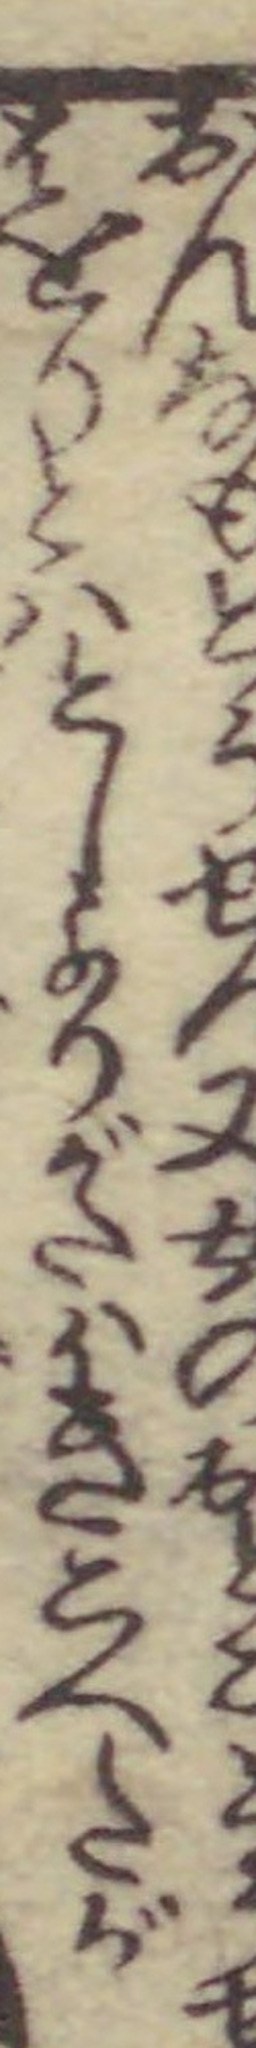はをりとはとしよりがたはきこへたが
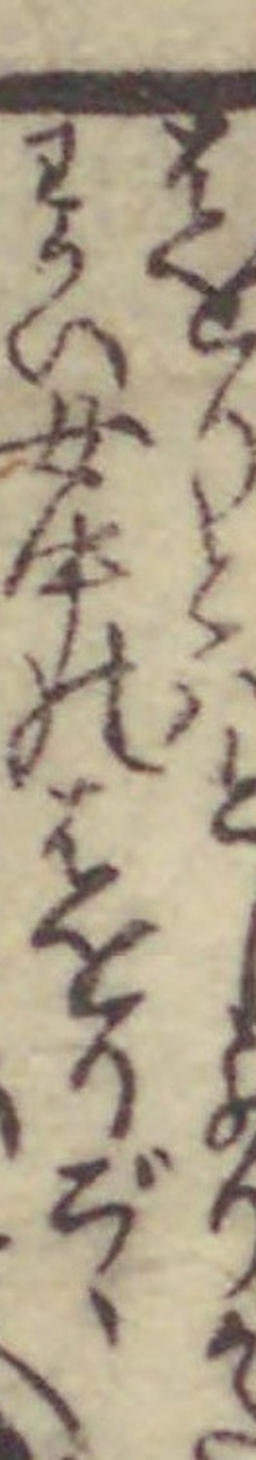わかい女中のはをりごゝ
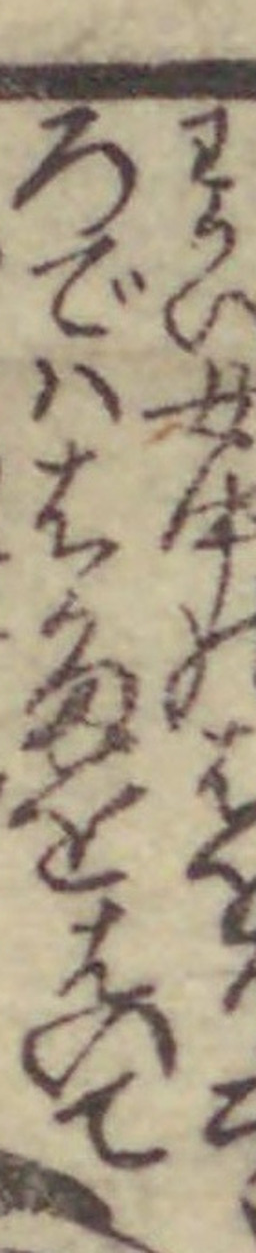ろでははかまをはいて
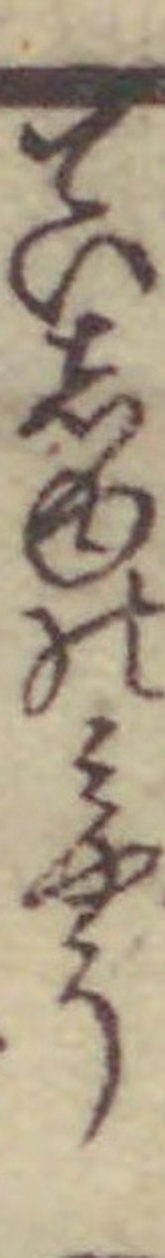ていしゆのみやう
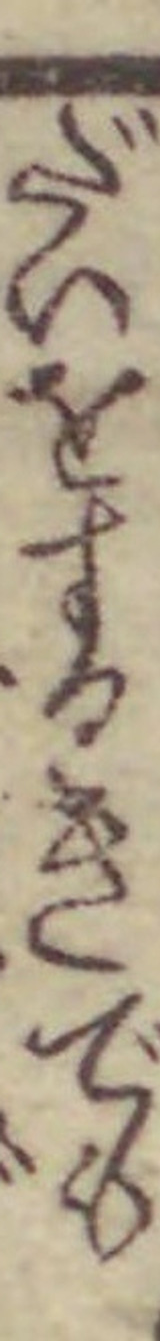だいをするきでも
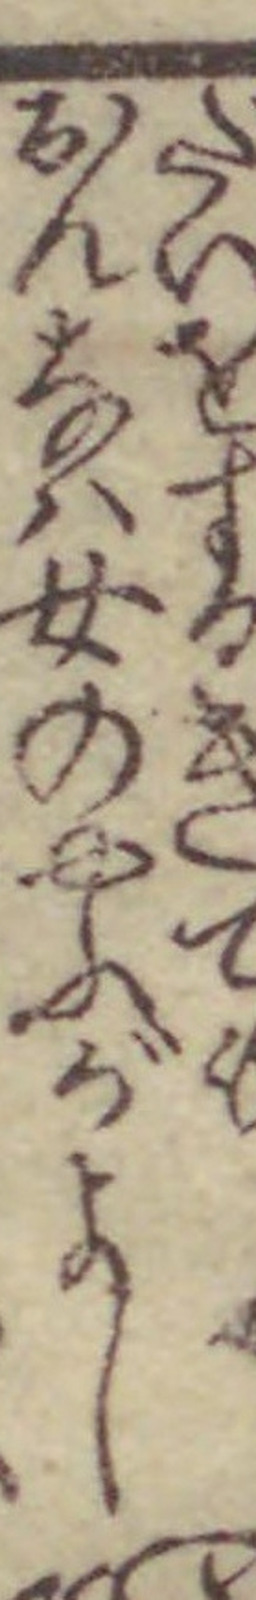おんなは女のやふがよし
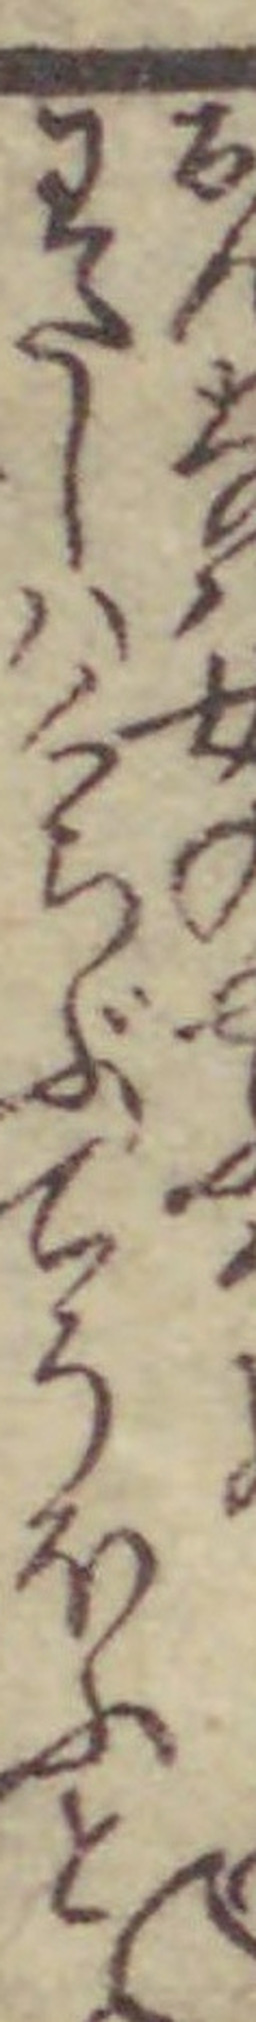わたしはくちぶてうほふと
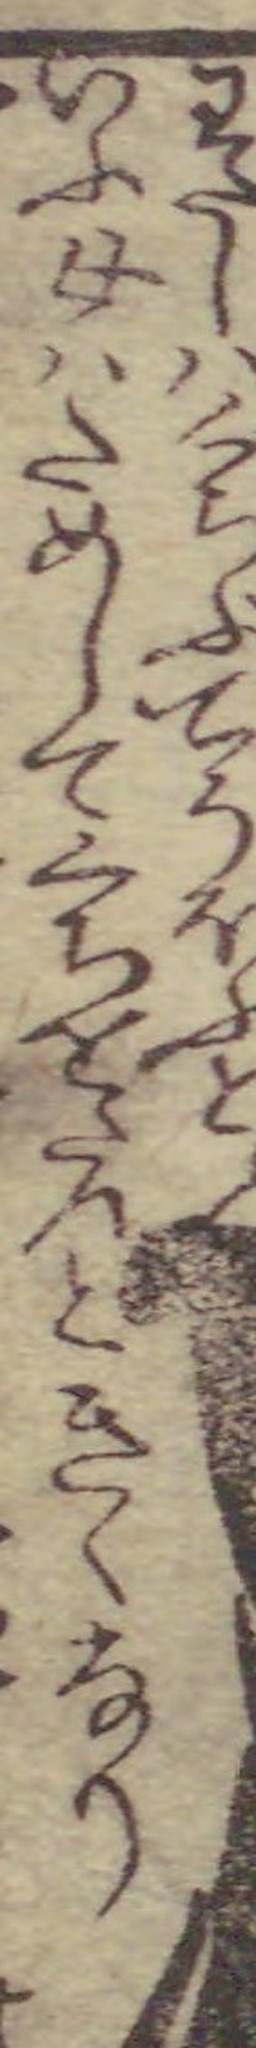いふ女はためしてくちをたんときくなり
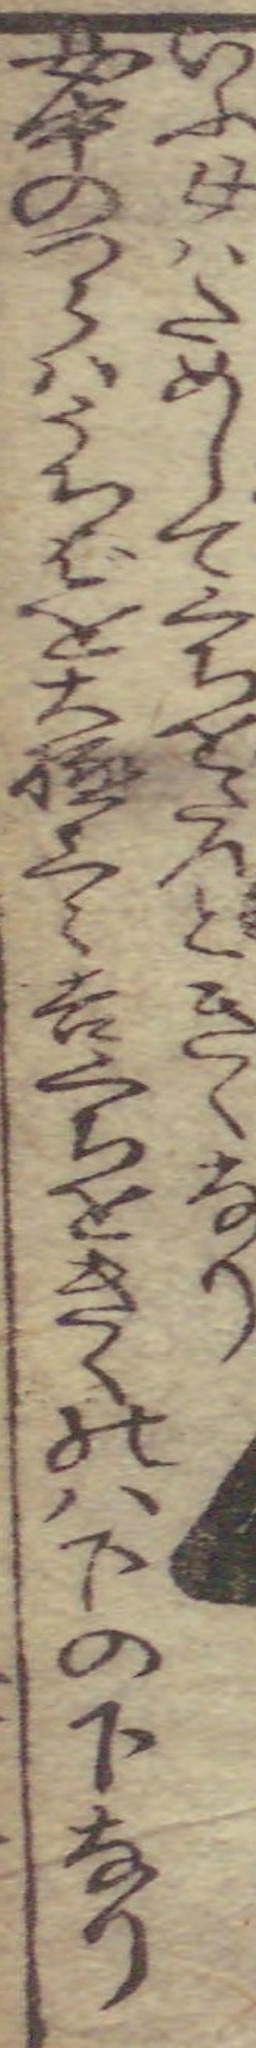女中のつらはうちはを大極上〻吉くちをきくのは下の下なり
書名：大通人穴[サガシ] 3巻
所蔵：国立国会図書館 National Diet Library, JAPAN
